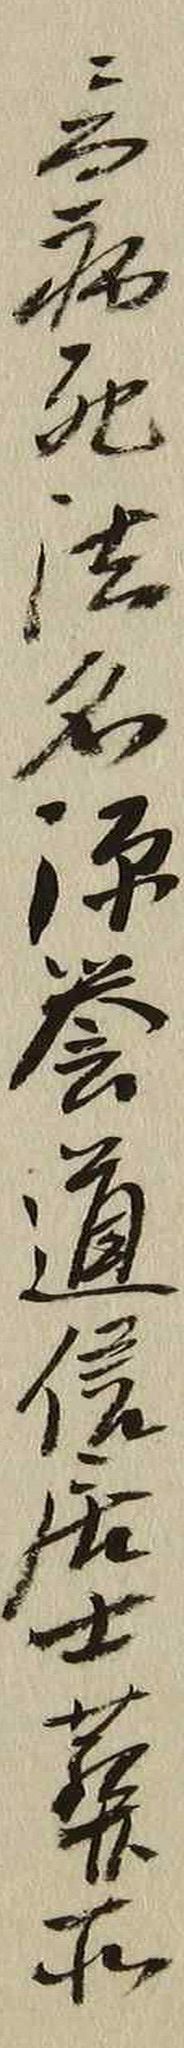ニ而病死法名源誉道信居士葬所
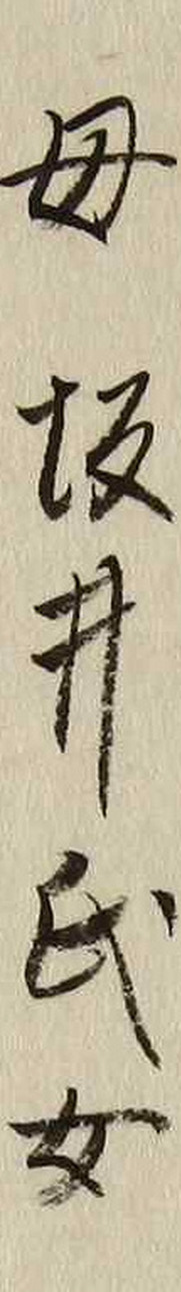母坂井氏女
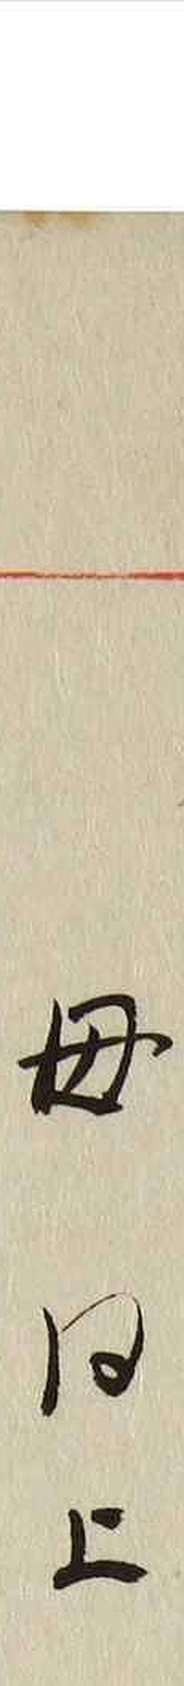母同上
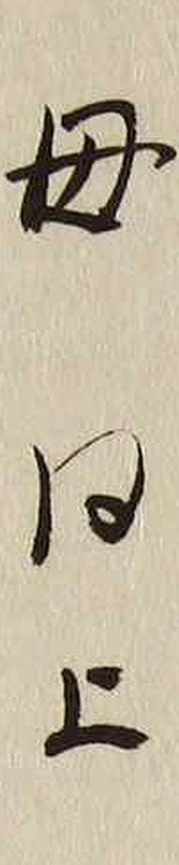母同上
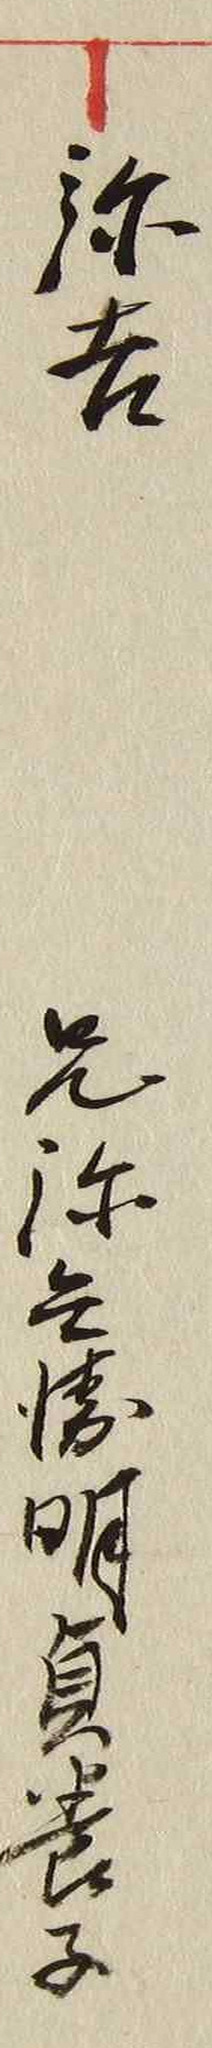弥吉兄弥兵衛明貞養子
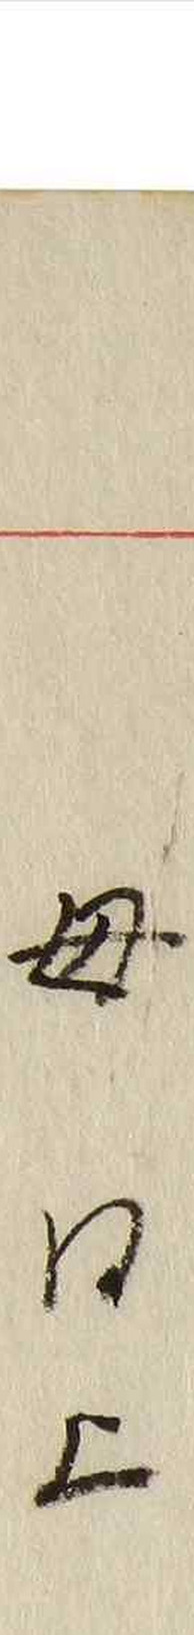母同上
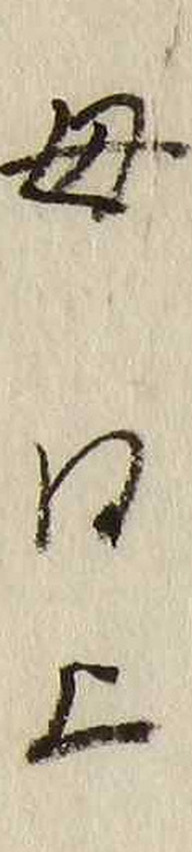母同上

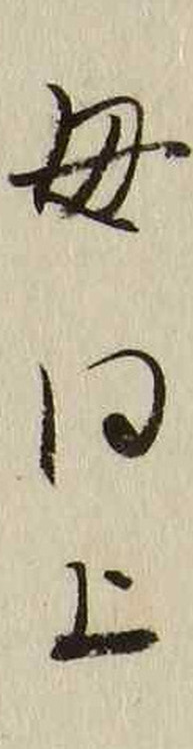母同上
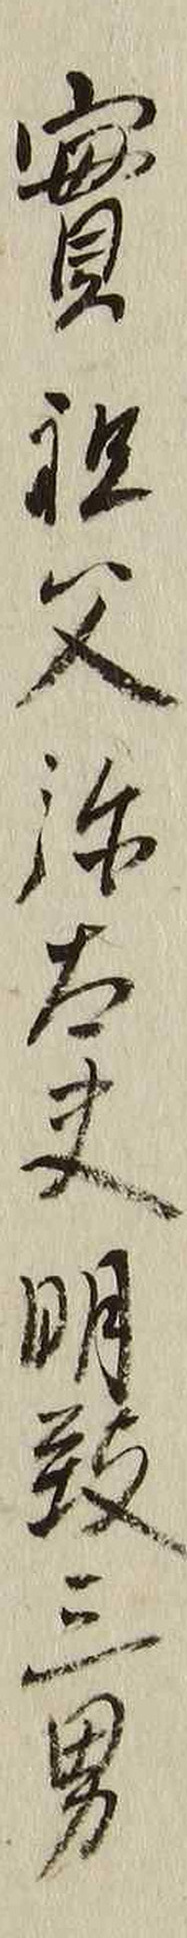実祖父弥太夫明致三男
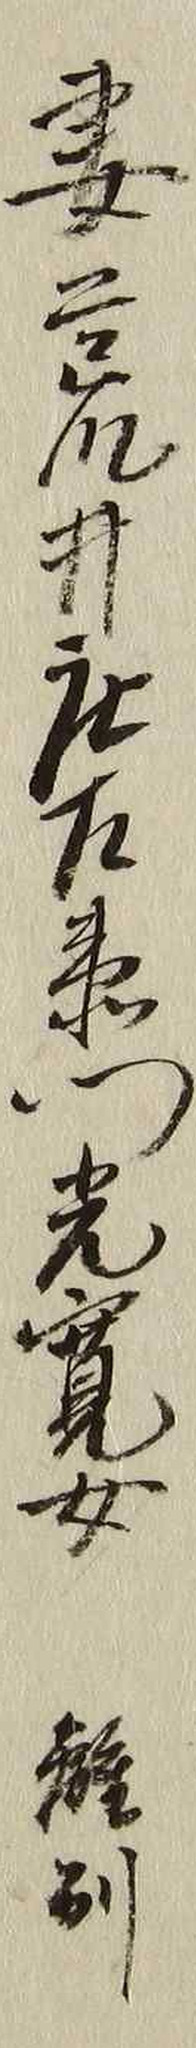妻荒井庄左衛門光寛女離別
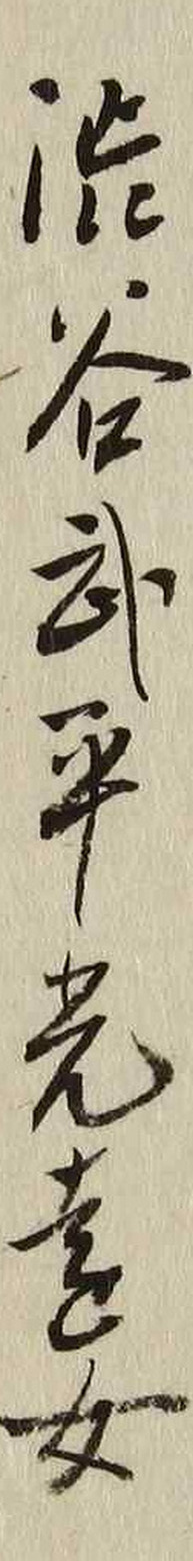渋谷武平光遠女
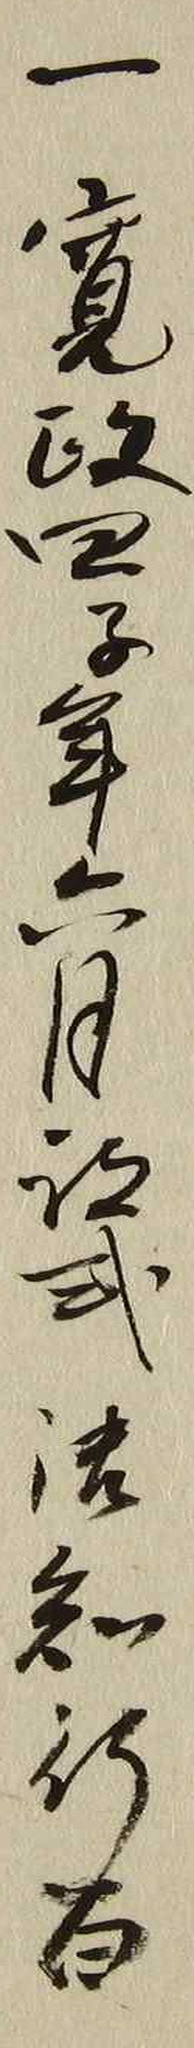一寛政四子年六月跡式御知行百
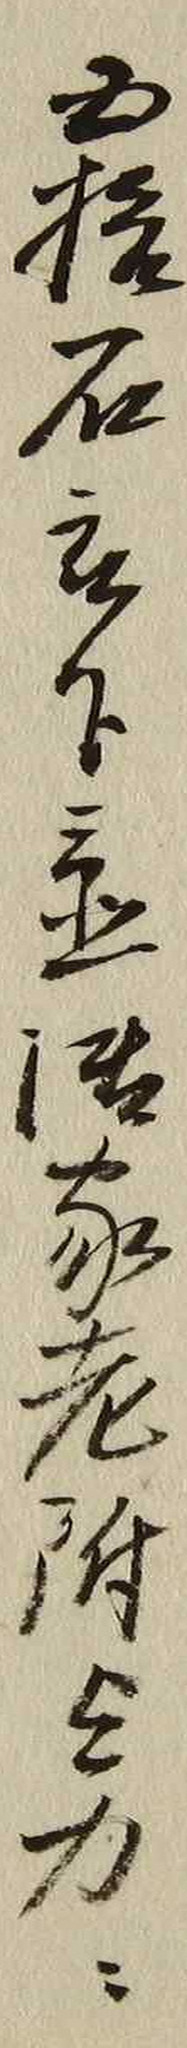五拾石被下置御家老附与今力
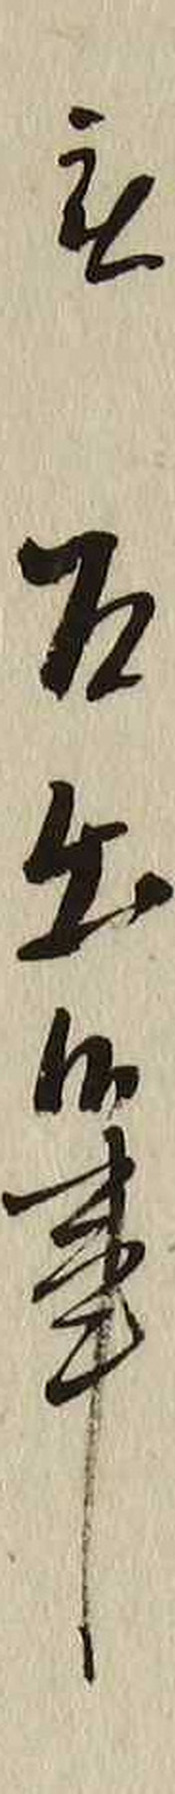被召出候事
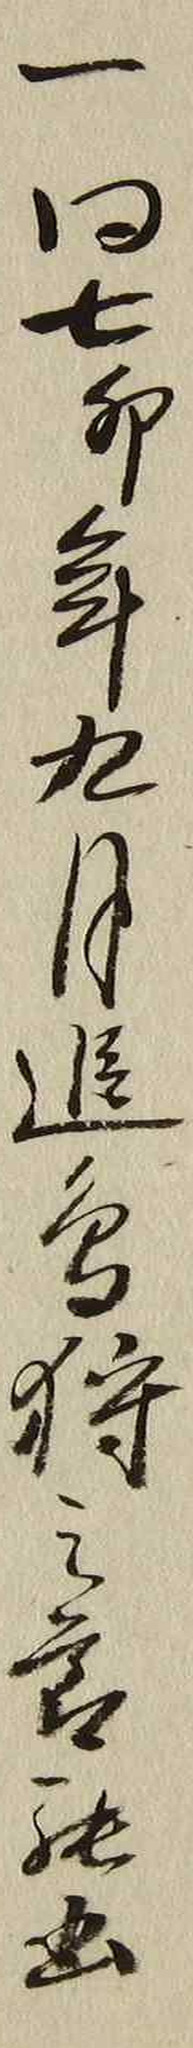一同七卯年九月追鳥狩之節罷出
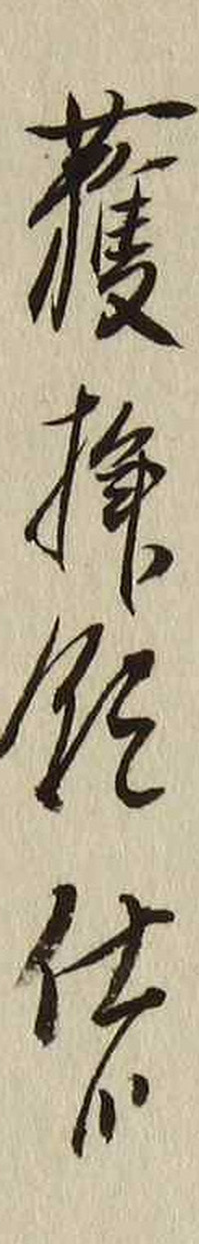獲拝領仕候
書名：諸士系譜　巻之350　せ之部1冊全
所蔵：会津若松市立会津図書館
